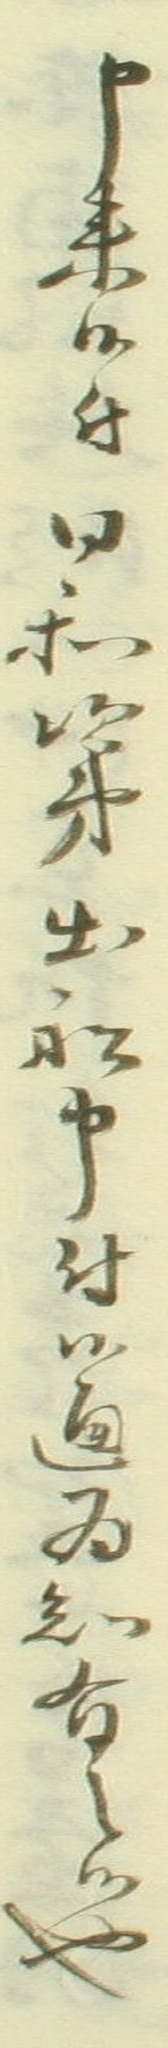申来候付日和次第出船申付候通為知有之候也

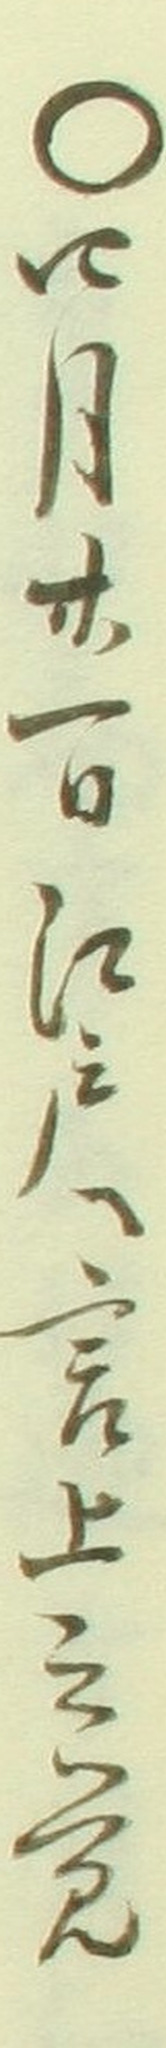〇四月廿一日江戸へ言上之覚
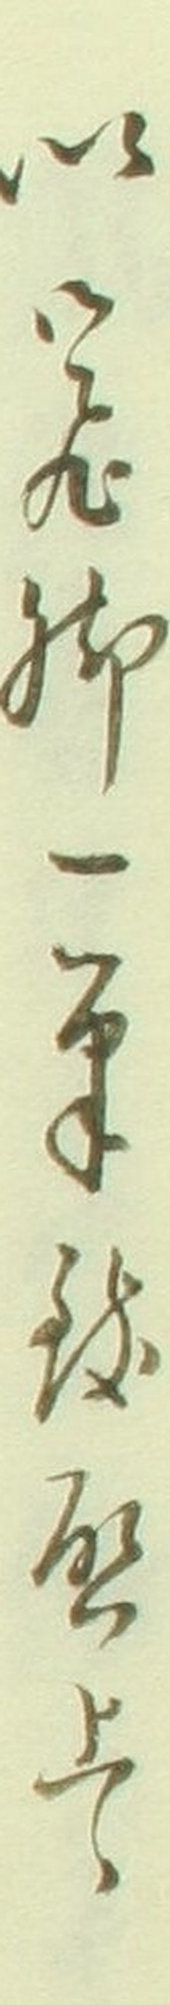以飛脚一筆致啓上候
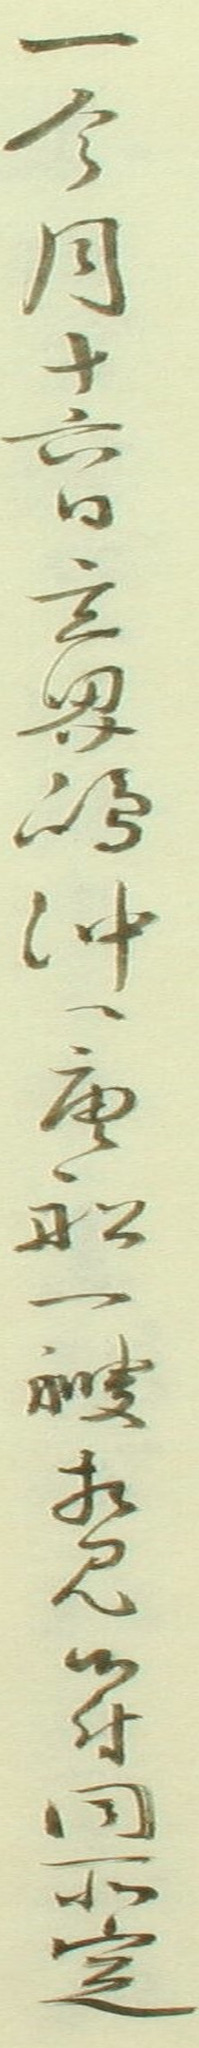一今月十六日玄海島沖へ唐船一艘相見候付同所定
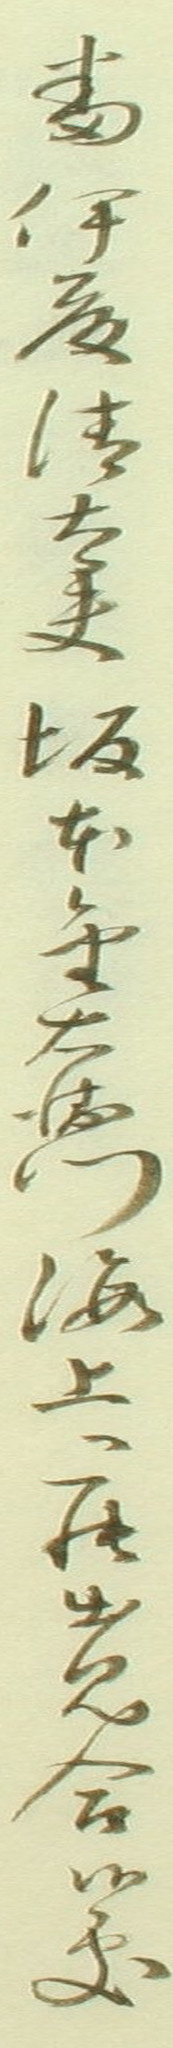番伊藤清太夫坂本金右衛門海上へ罷出見合候処
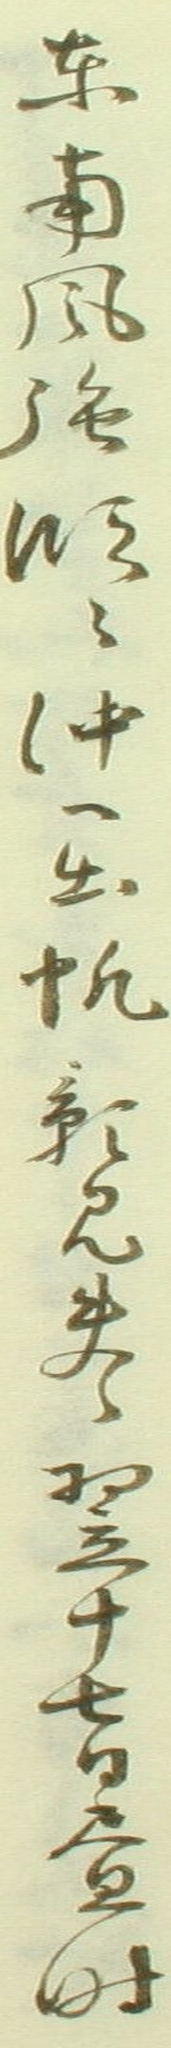東南風強段々沖へ出帆影見失候翌十七日昼時
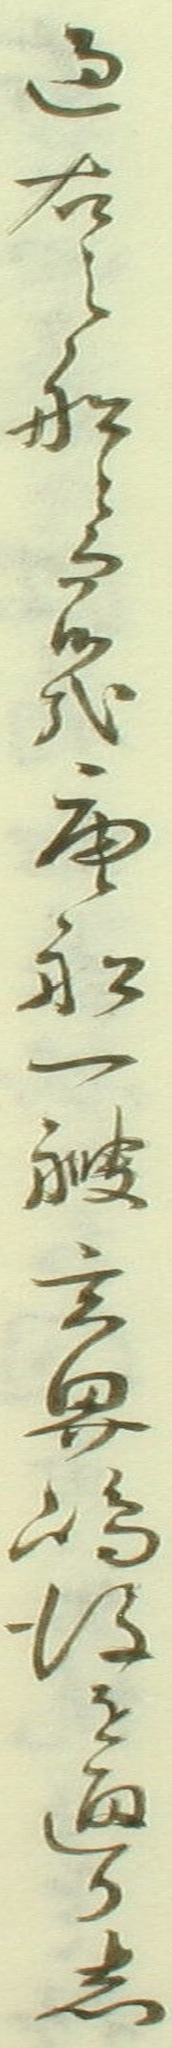過右之船に而候哉唐船一艘玄界島後を通り志
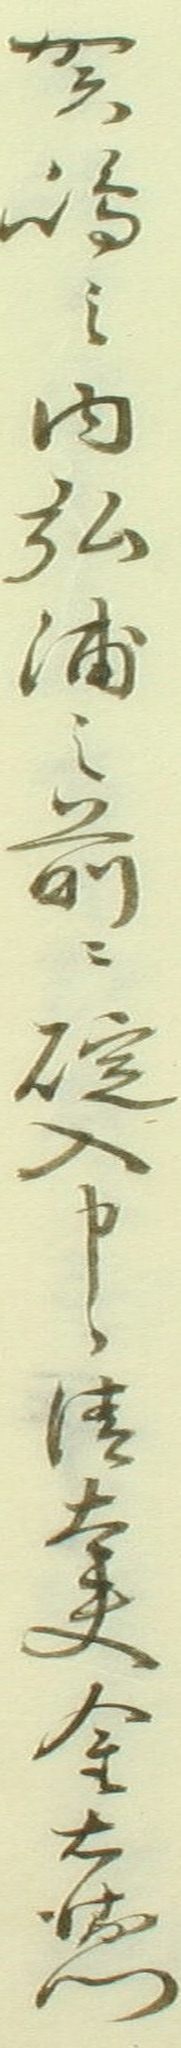賀島之内弘浦之前に碇入申候清太夫金右衛門
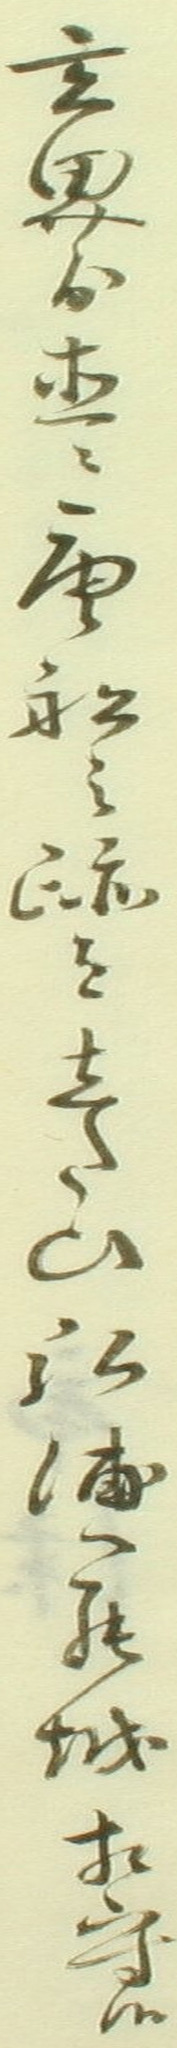玄界ゟ直に唐船之跡をしたひ弘浦へ罷越相守候
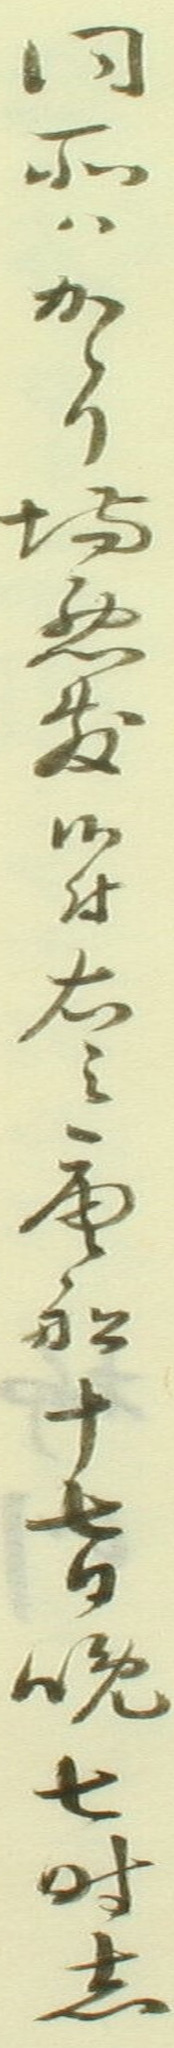同所はかゝり場悪敷候付右之唐船十七日晩七時志
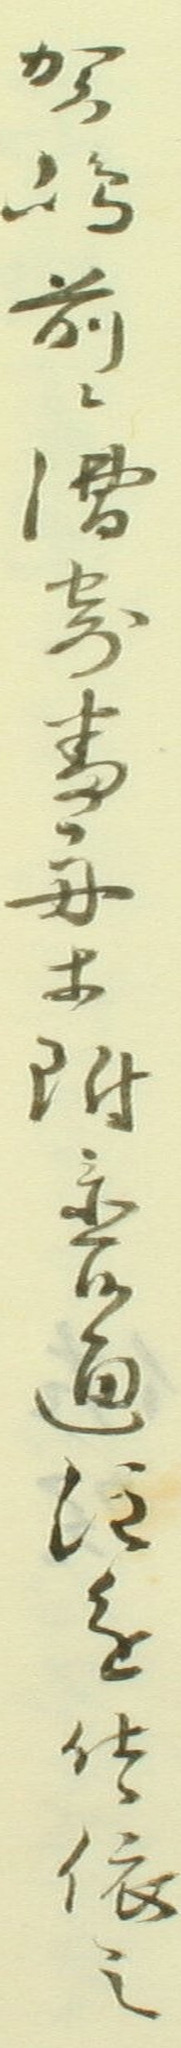賀島前に漕寄番舟等附置候通注進仕候依之
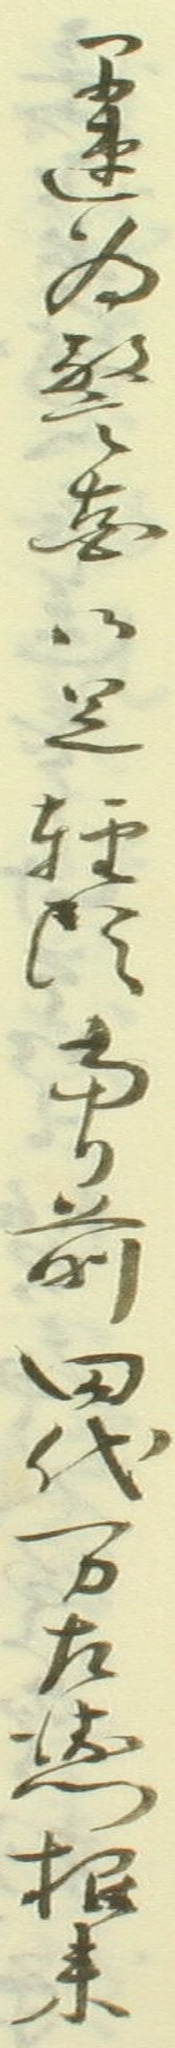早速為警固御足軽頭当り前田代万左衛門根来
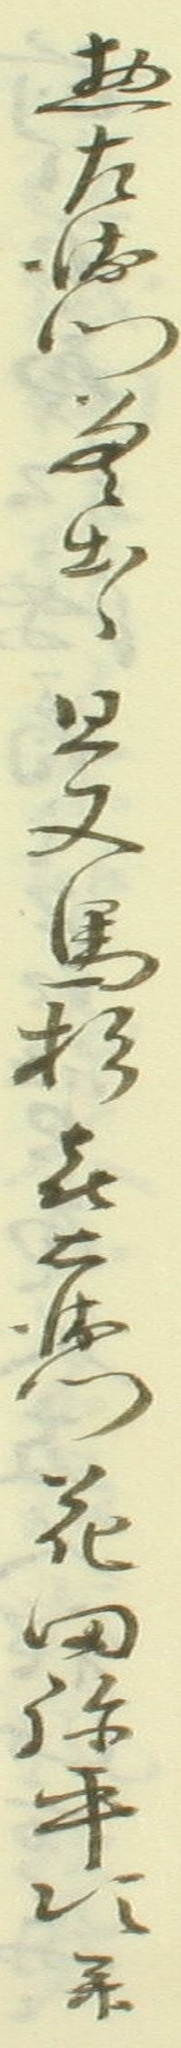惣左衛門差出候且又馬杉喜右衛門花田弥平次并
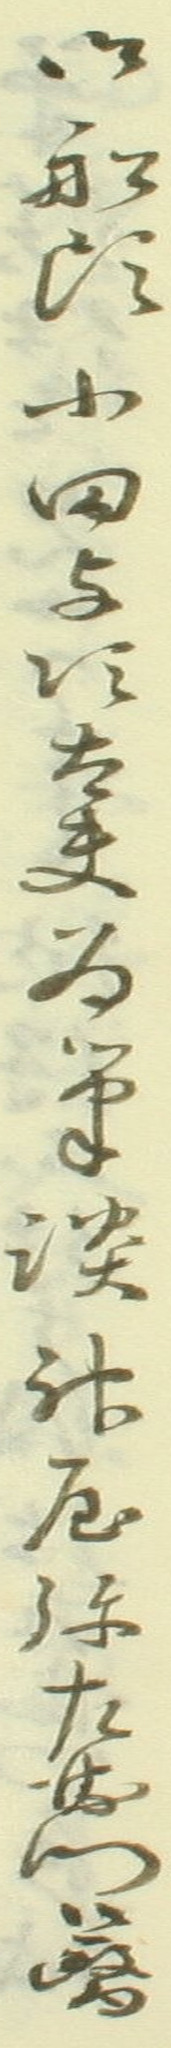御船頭小田与次太夫為筆談神屋弥左衛門御医
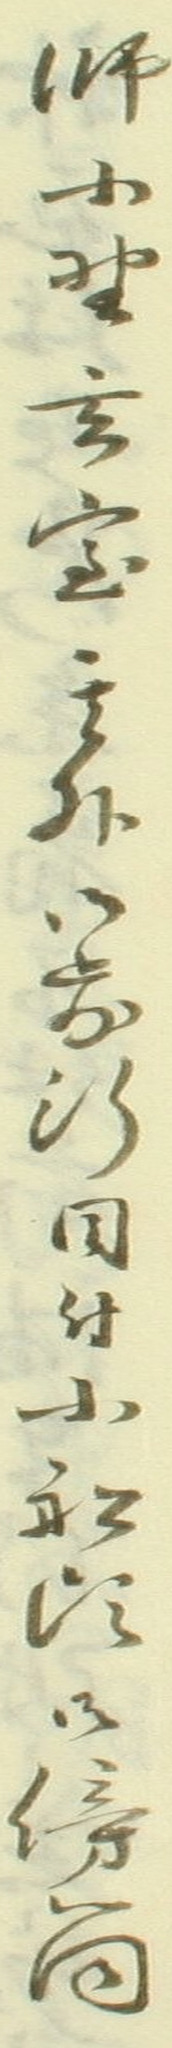師小野玄宝其外御歩行目付小船頭御傍一同
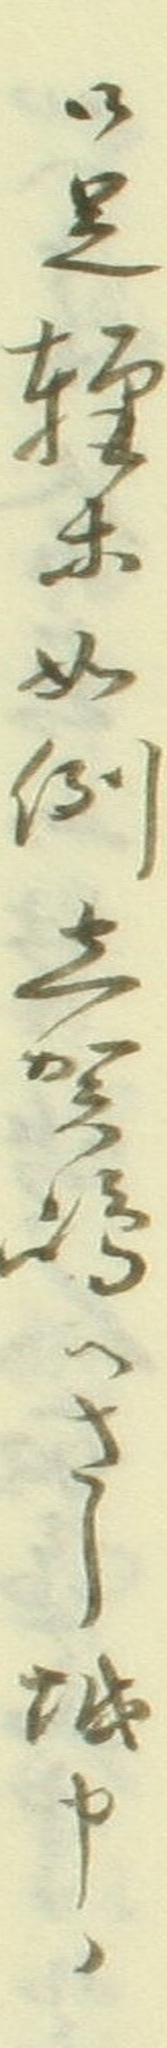御足軽等如例志賀島へさし越申候
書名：異国船漂着記
